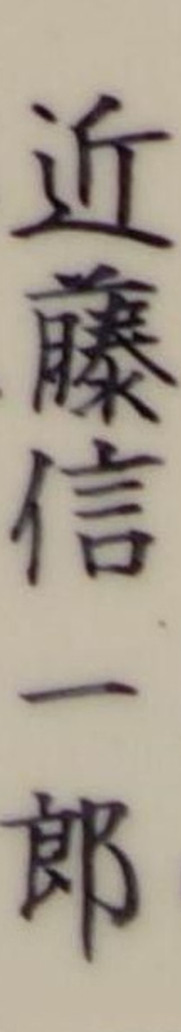近藤信一郎
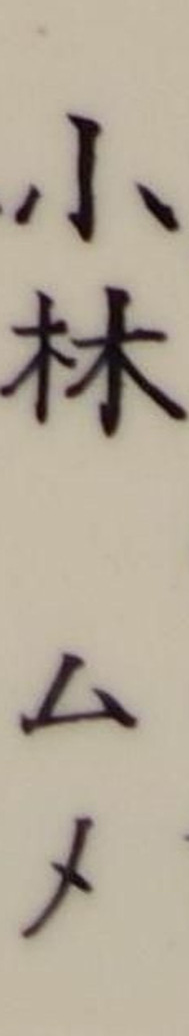小林ムメ
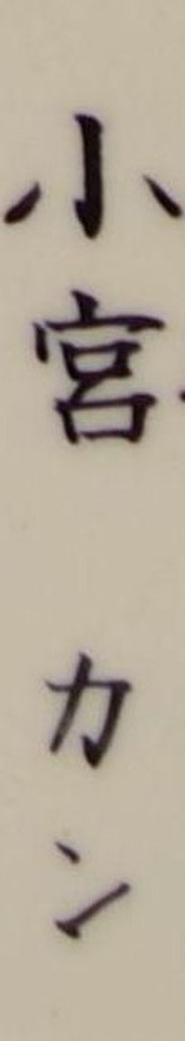小宮カン
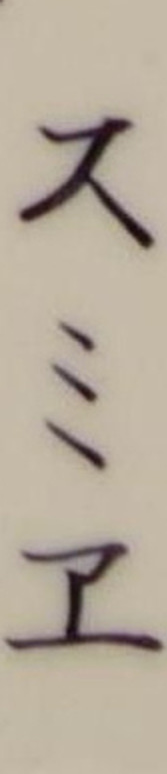スミエ
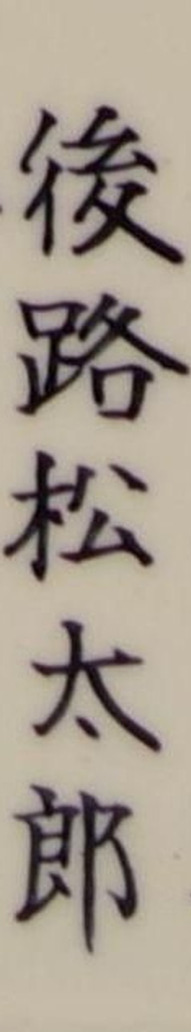淡路松太郎
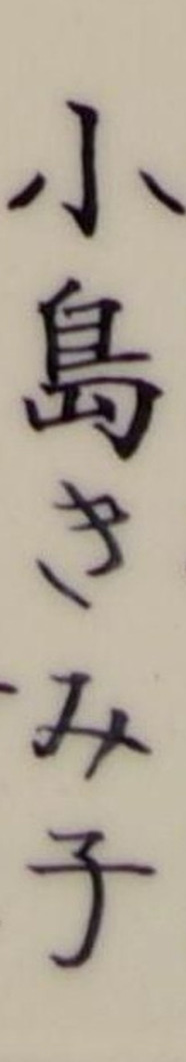小島きみ子
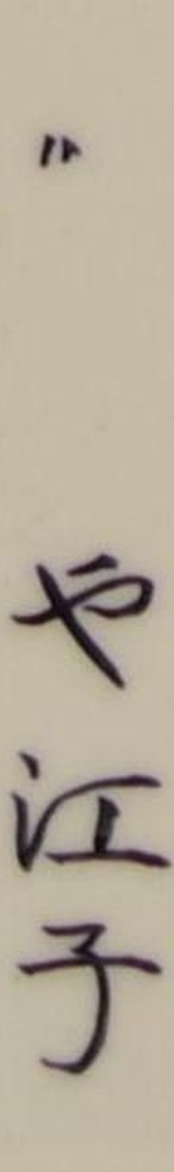やえ子
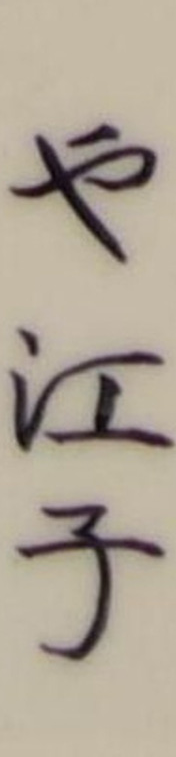やえ子
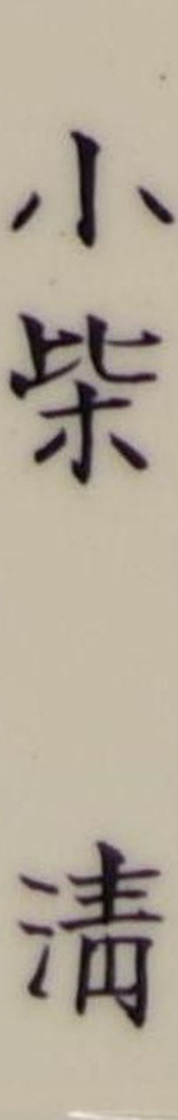小柴清
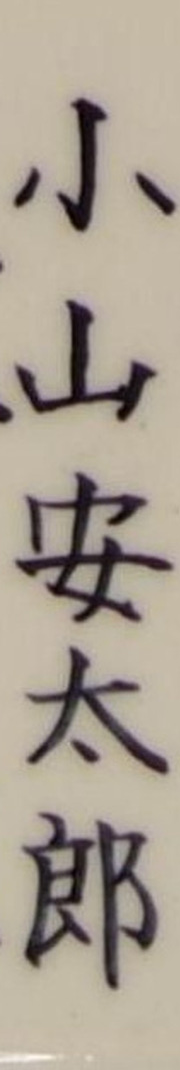小山安太郎
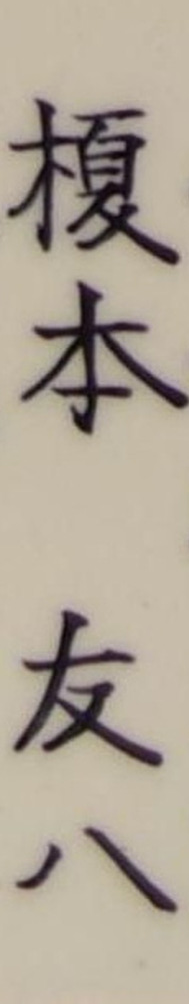榎本友八
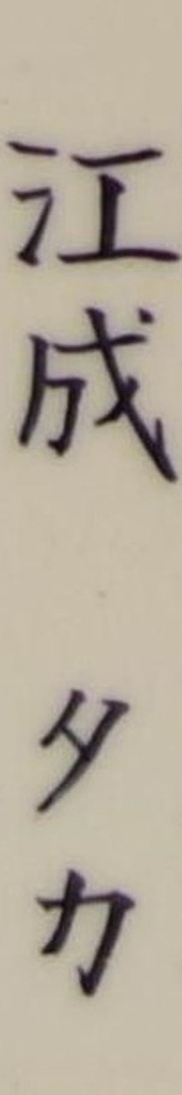江成タカ
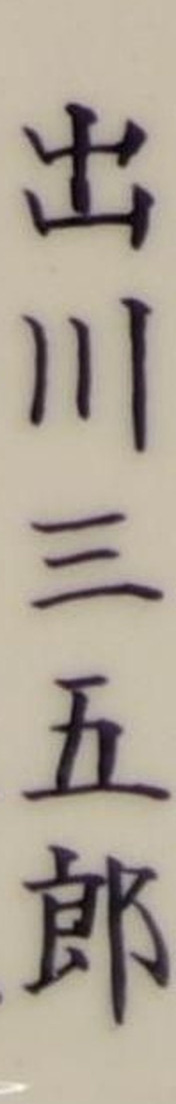出川三五郎
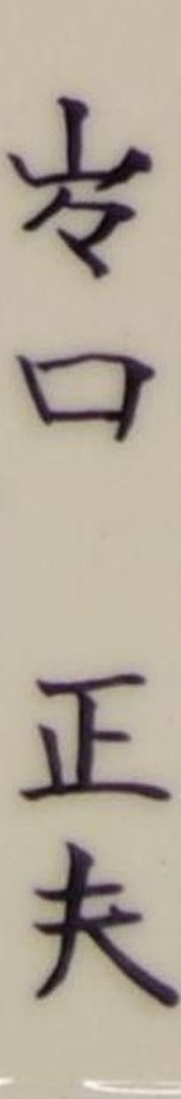㞮口正夫
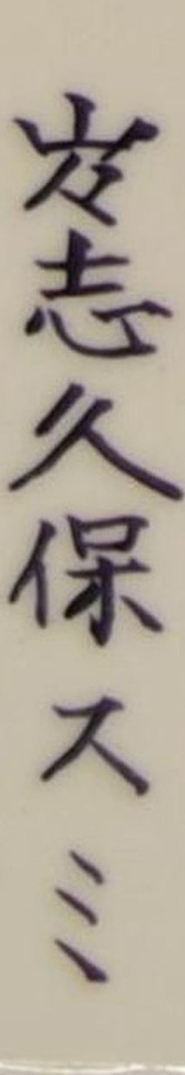㞮志久保スミ
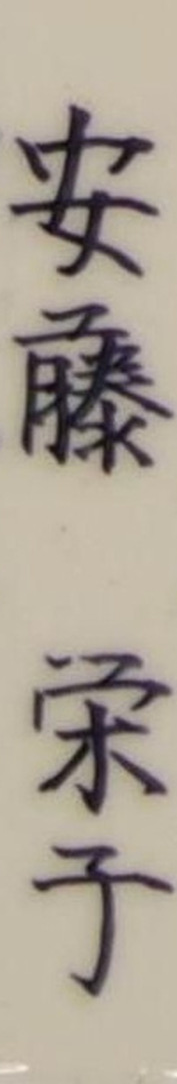安藤栄子
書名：M~S
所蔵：高野山金剛峯寺
